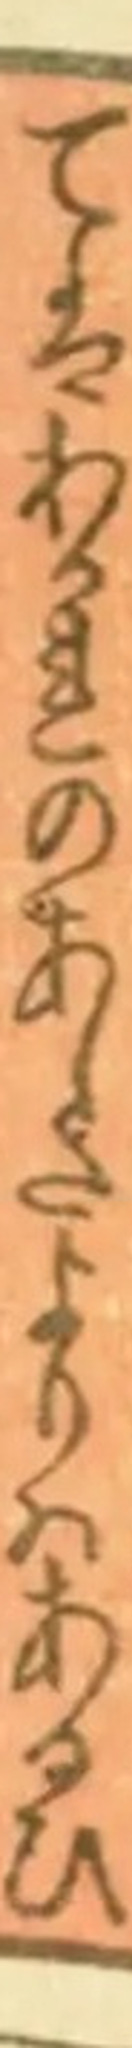てはわかれのあしたよりはあるひ
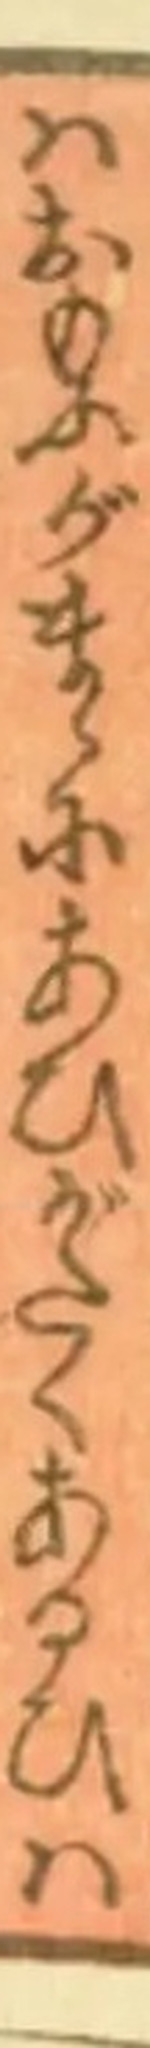はおもふがまゝにあひがたくあるひは
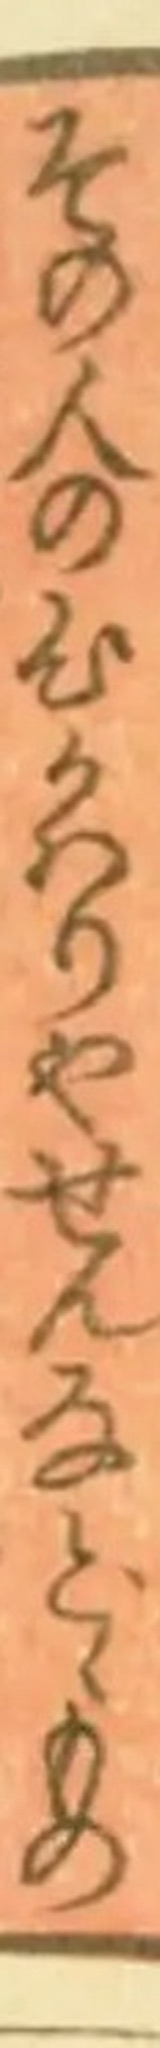その人の心かはりやせんなどゝもの
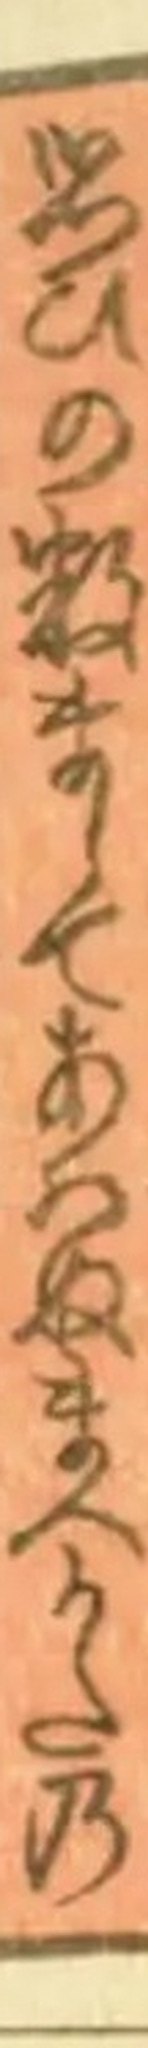思ひの数ましてあはぬまへうた乃
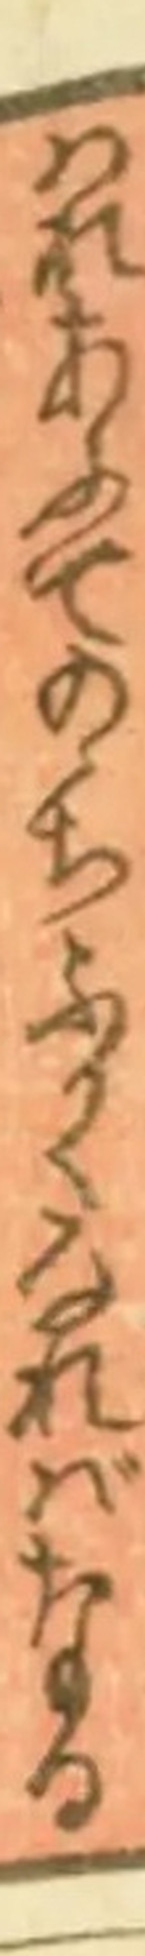はれあふてのちふかくなればなる
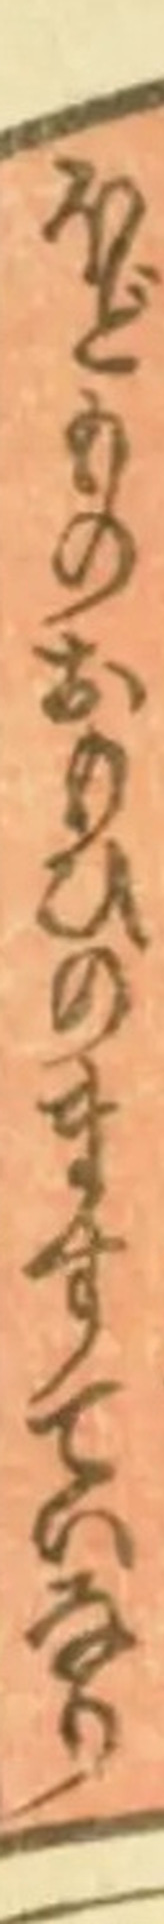ほどものおもひのますていなり
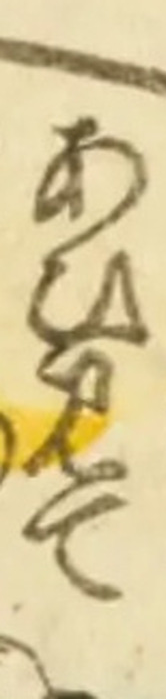あひ見て
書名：四十三ばん　中納言敦忠
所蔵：国立国会図書館 National Diet Library, JAPAN
